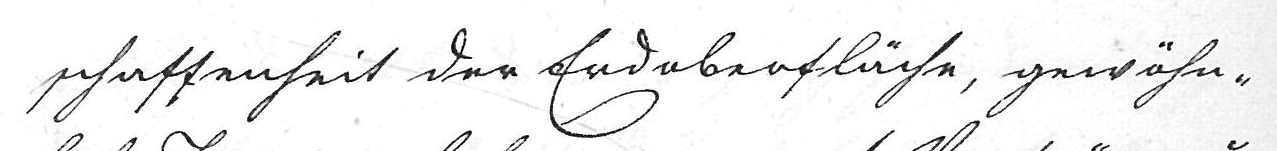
schaffenheit der Erdoberfläche, gewöhn-
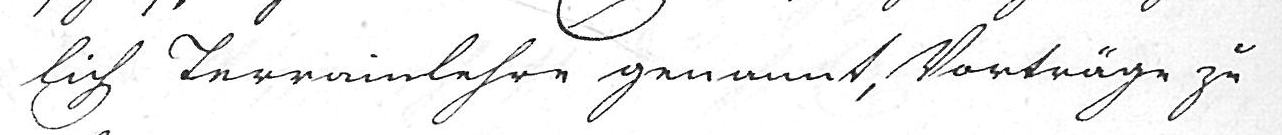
lich Terrainlehre genannt, Vorträge zu
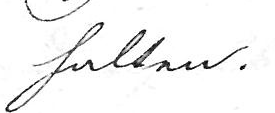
halten.
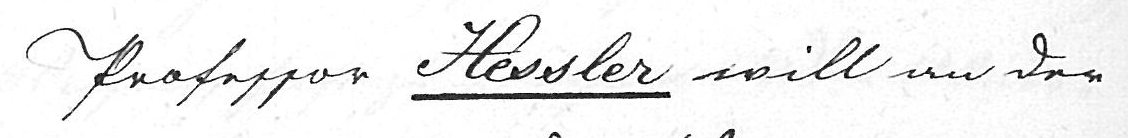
Professor Hessler will an der
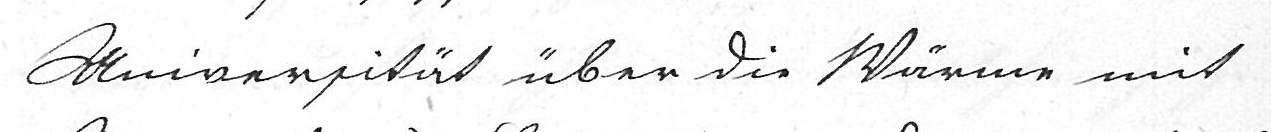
Universität über die Wärme mit
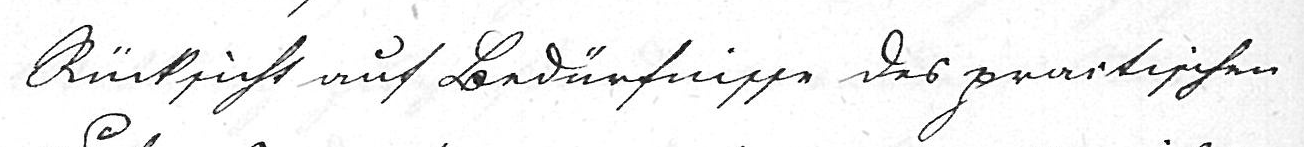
Rücksicht auf Bedürfnisse des practischen
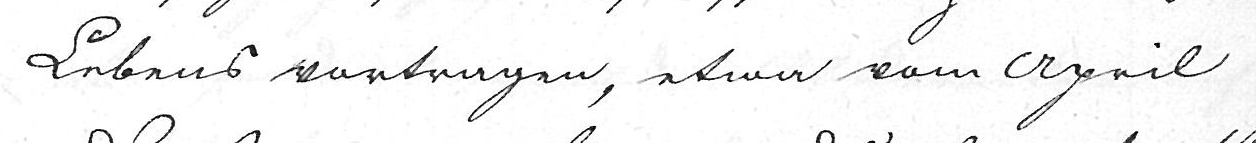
Lebens vortragen, etwa vom April
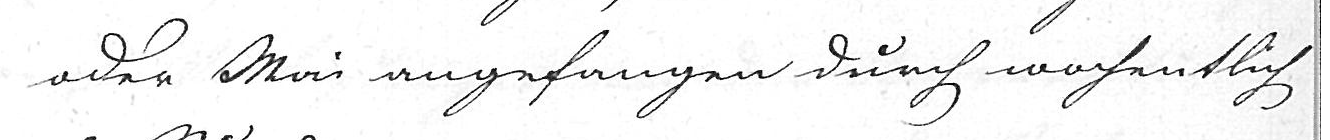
oder Mai angefangen durch wochentlich
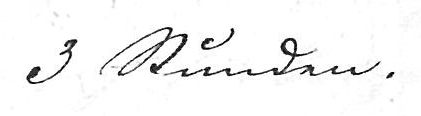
3 Stunden.
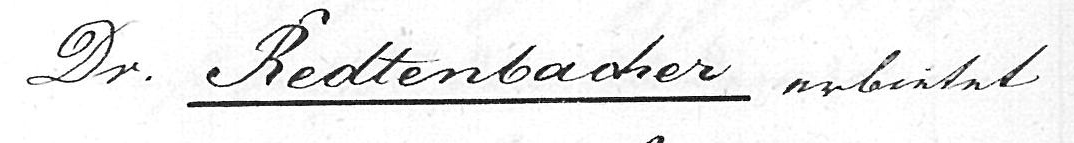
Dr. Redtenbacher erbietet
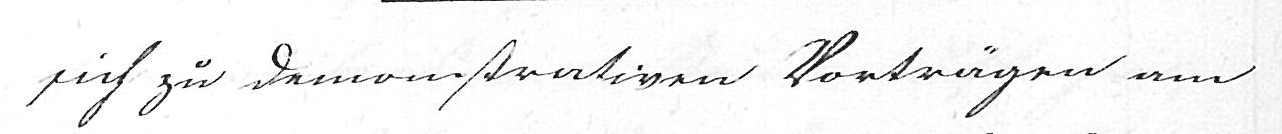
sich zu demonstrativen Vorträgen am
